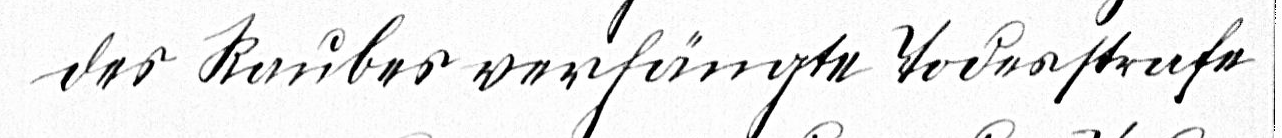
des Raubes verhängte Todesstrafe
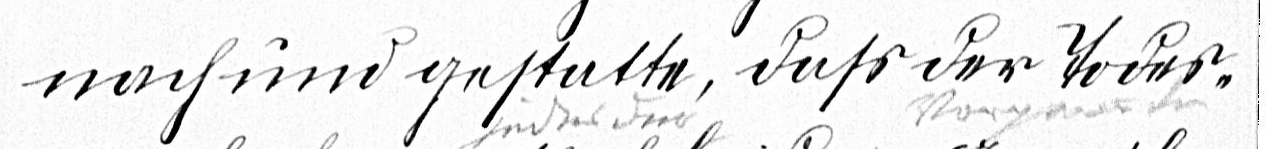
nach und gestatte, dass der Todes¬
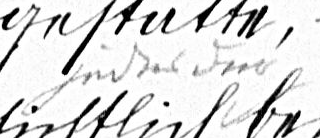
jedes der
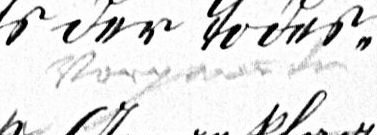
Vorgans den
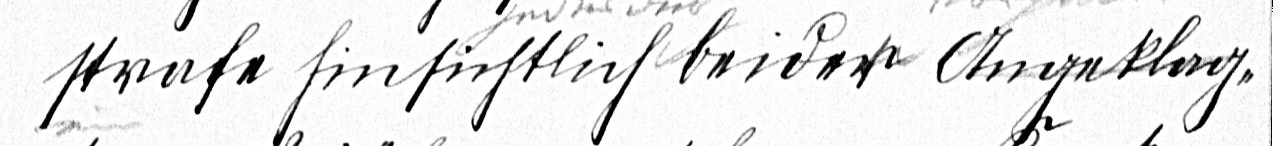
strafe hinsichtlich beider Angeklag¬
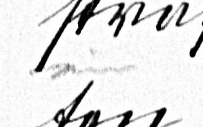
ein
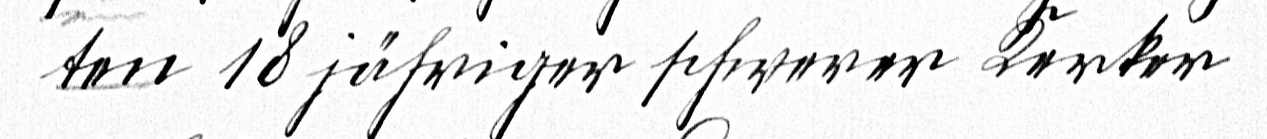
ten 18 jähriger schwerer Kerker
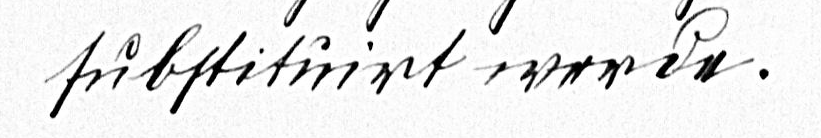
substituirt werde.
